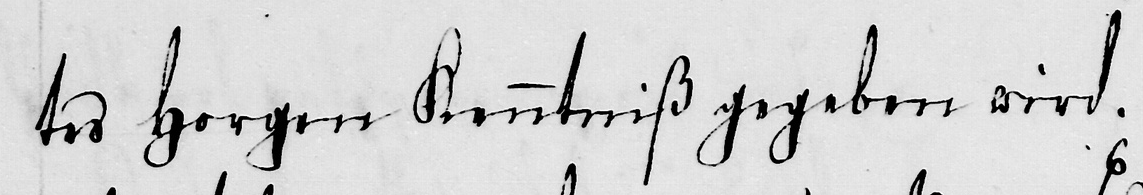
tes Horgen Kenntniß gegeben wird.
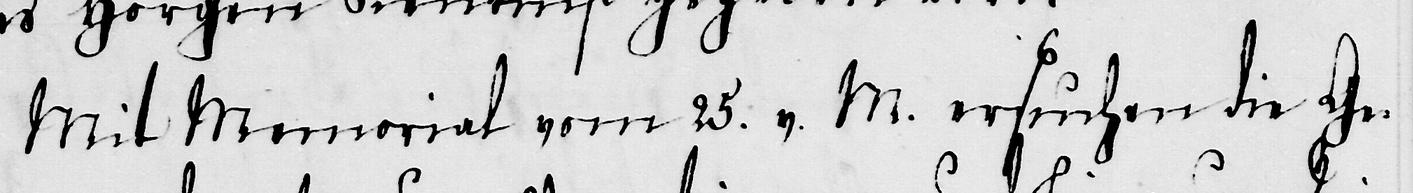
Mit Memorial vom 25. v. M. ersuchen die Ge¬
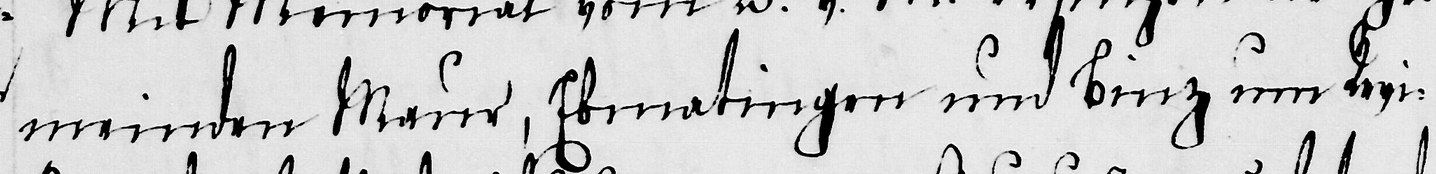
meinden Maur, Ebmatingen und Binz um Revi¬
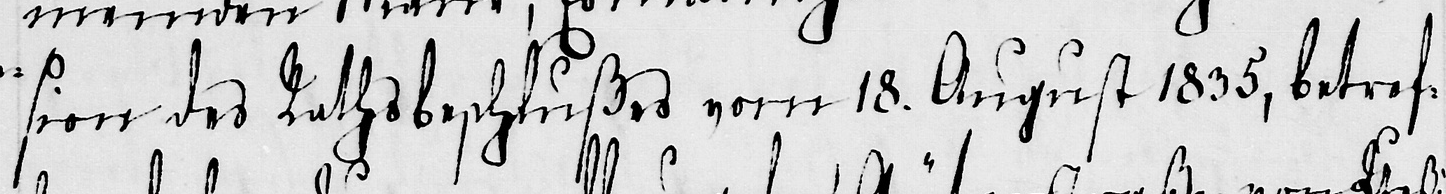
sion des Rathsbeschlußes vom 18. August 1835, betref¬
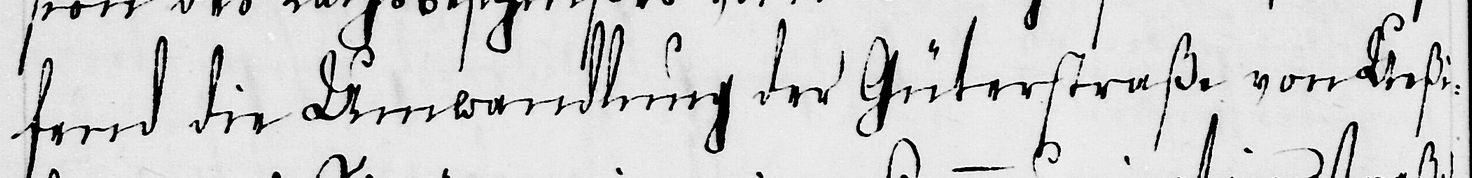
fend die Umwandlung der Güterstraße von Ueßi¬
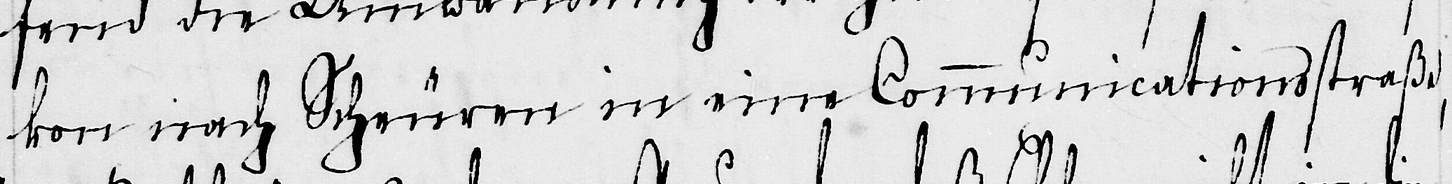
kon nach Scheuren in eine Communicationsstraß¬
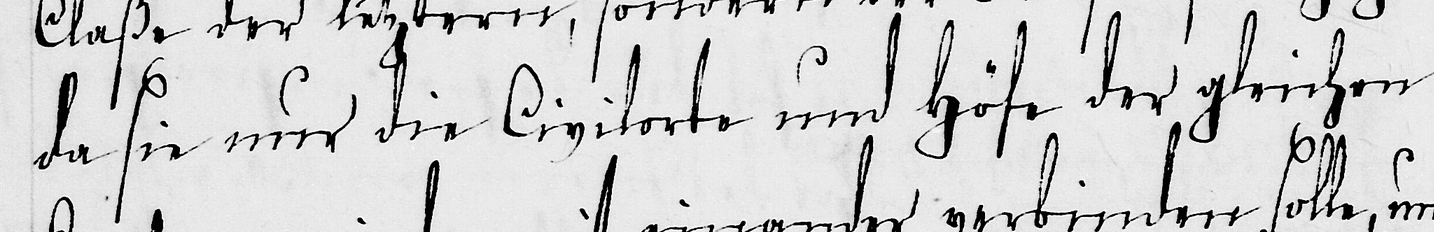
da sie nur die Civilorte und Höfe der gleichen
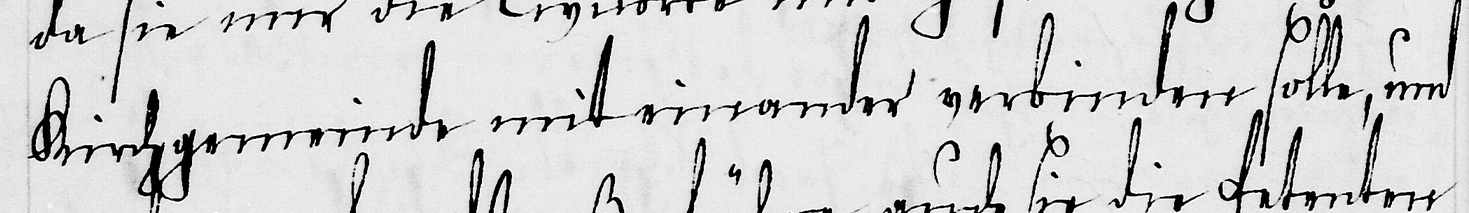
Kirchgemeinde miteinander verbinden solle, und
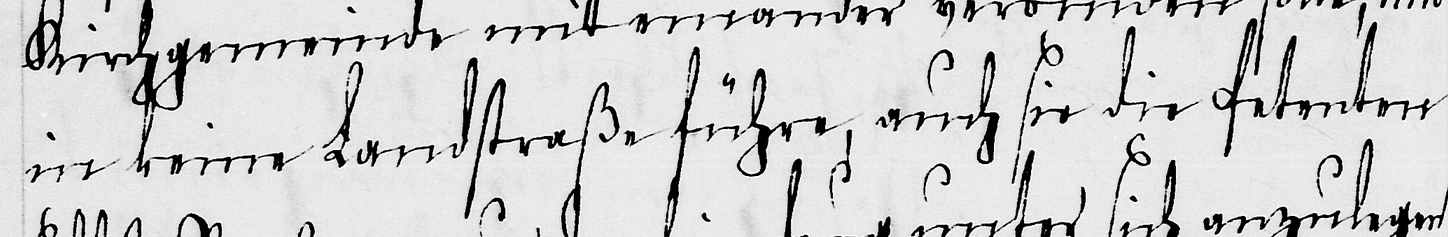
in keine Landstraße führe, auch sie die Petenten
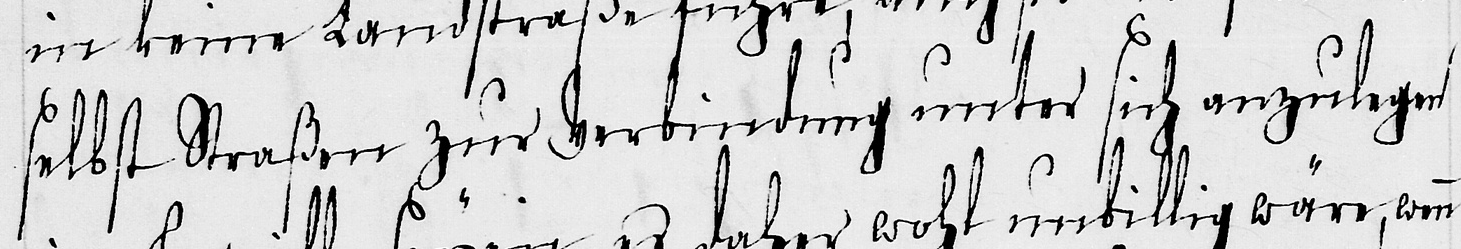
selbst Straßen zur Verbindung unter sich anzulege¬
